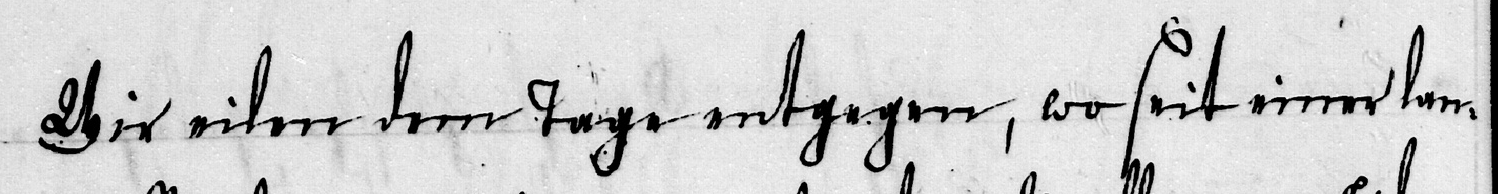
Wir eilen dem Tage entgegen, wo seit einer lan¬
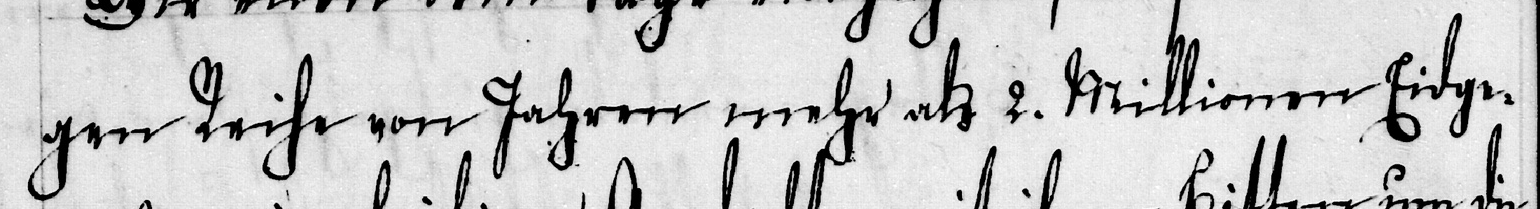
gen Reihe von Jahren mehr als 2. Millionen Eidge¬
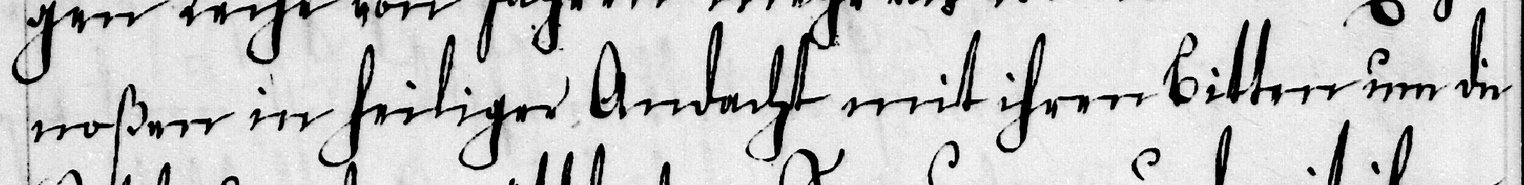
noßen in heiliger Andacht mit ihren Bitten um die
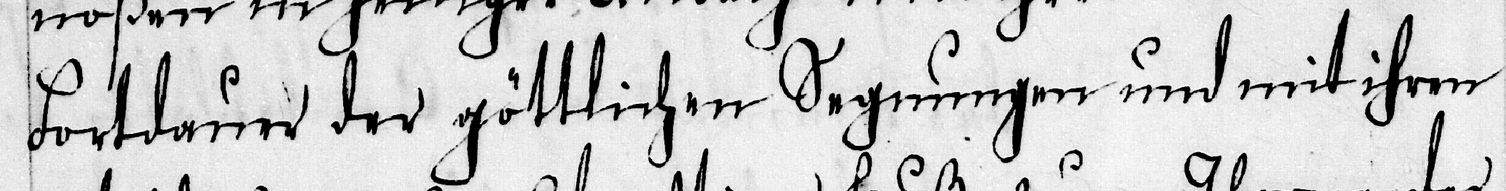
Fortdauer der göttlichen Segnungen und mit ihren
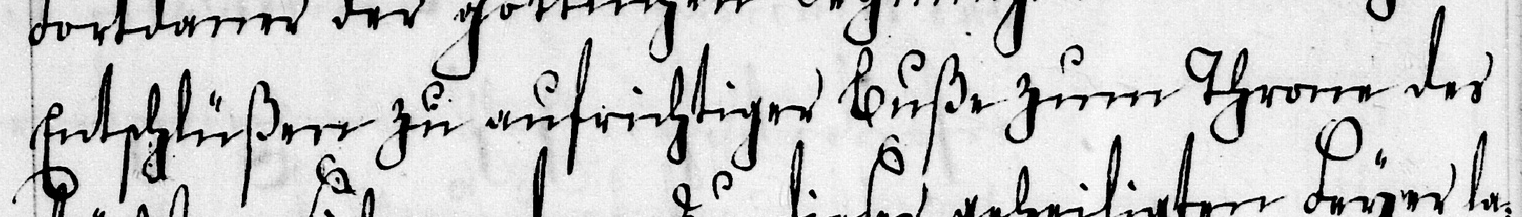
Entschlüßen zu aufrichtiger Buße zum Throne des
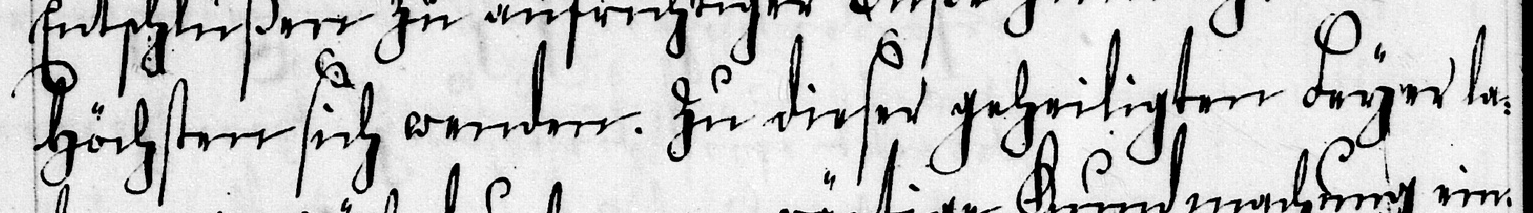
Höchsten sich wenden. Zu dieser geheiligten Feyer la¬
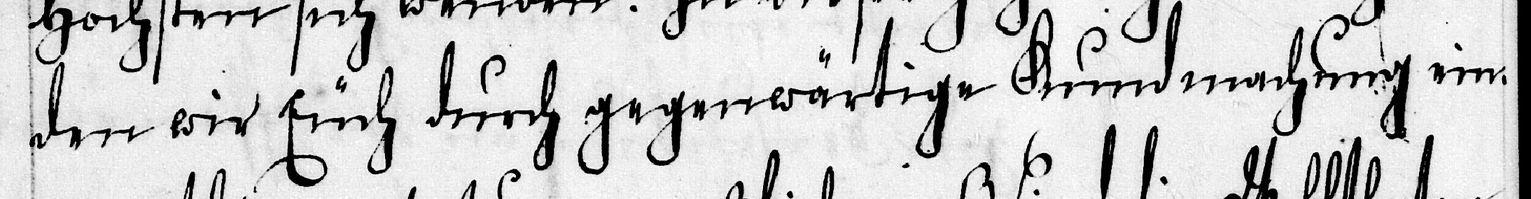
den wir Euch durch gegenwärtige Kundmachung ein.
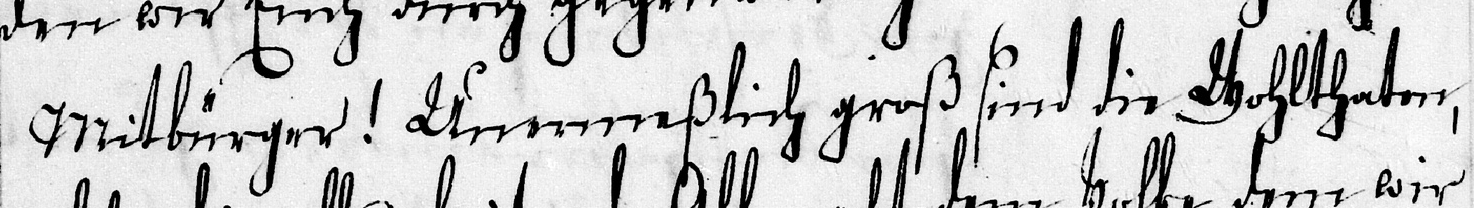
Mitbürger! Unermeßlich groß sind die Wohlthaten,
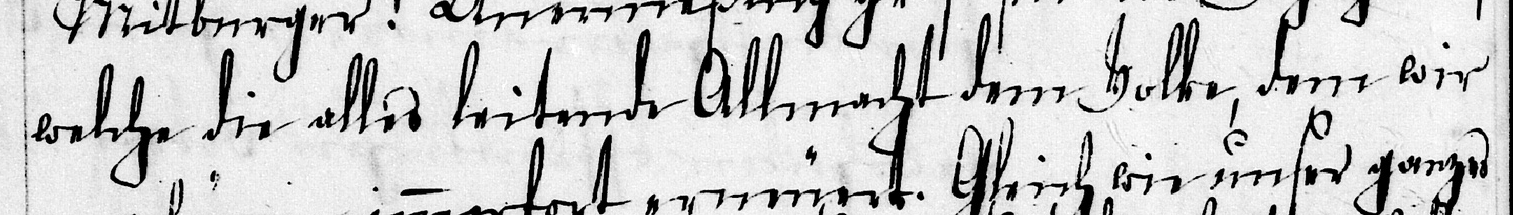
welche die alles leitende Allmacht dem Volke, dem wir
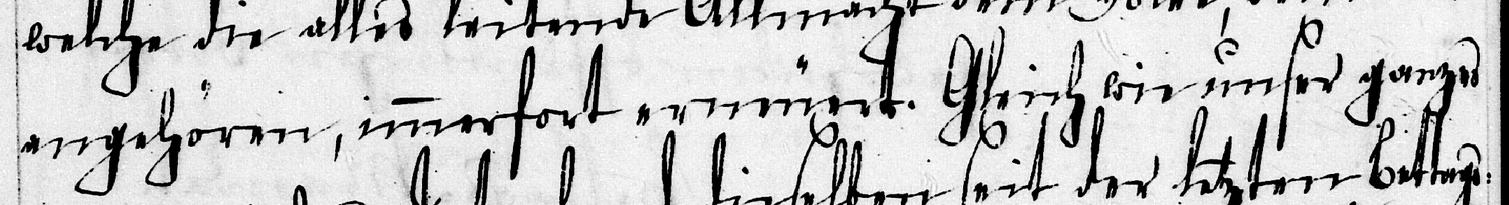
angehören, immerfort erneuert. Gleich wie unser ganzes
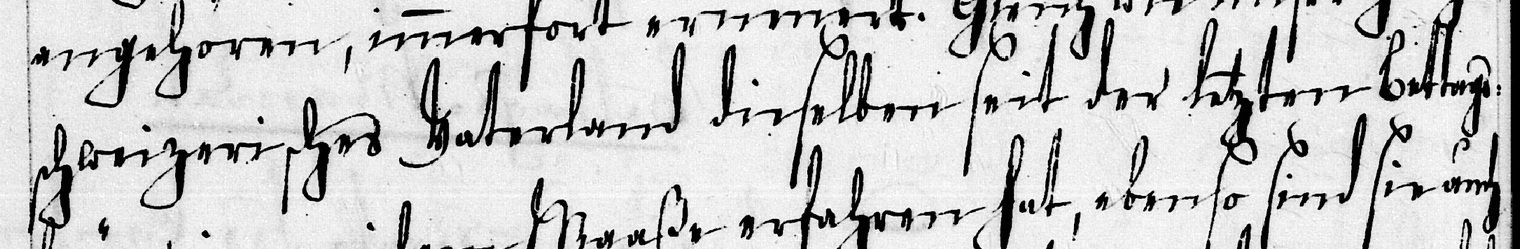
schweizerisches Vaterland dieselben seit der letzten Betta¬
